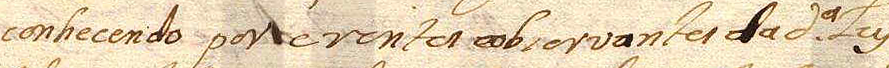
conhecendo por crentes e observantes da d.a Ley
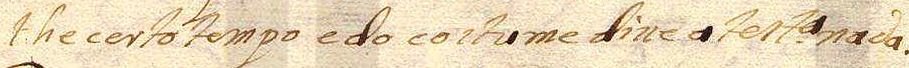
the certo tempo e do costume disse a test.a nada
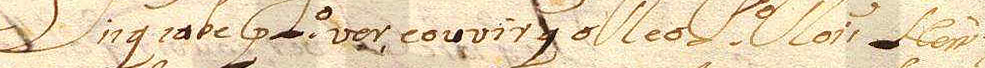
Dis q̄ sabe pL.o ver, e ouvir q̄ o Reo P.o Rois̄ Hens̄;
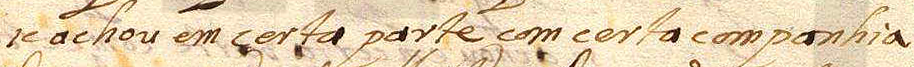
se achou em certa parte com certa companhia
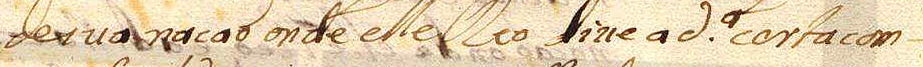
de sua naçaõ onde elle Reo disse a d.a certa com
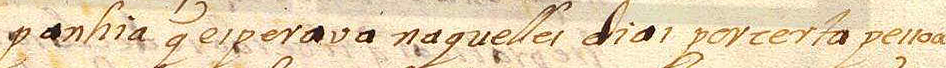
panhia q̄ esperava naquelles dias por certa pessoa
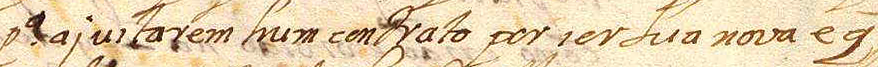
p.a ajustarem hum contrato por ser Lua nova e q̄
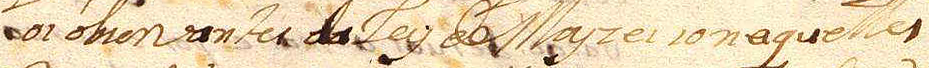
os observantes da Ley de Moyzes so naquelles
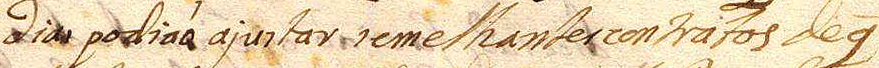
dias podiaõ ajustar semelhates contratos de q̄
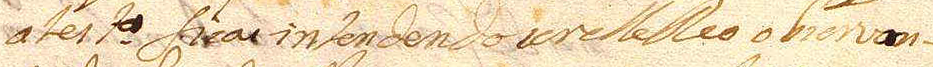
a test.a fica intendendo ser elle Reo observan
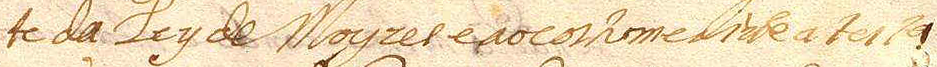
te da Ley de Moyzes e ao costume disse a testa
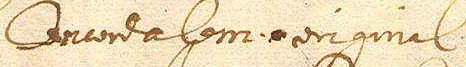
Concorda Com o original
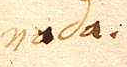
nada.
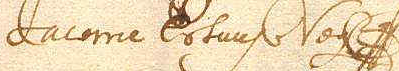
Iacome Esteues Nogra
